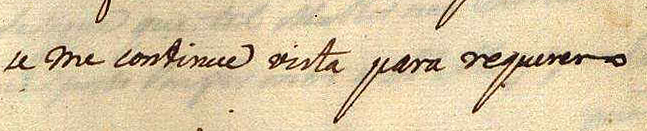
se me continue vista para requerer o
